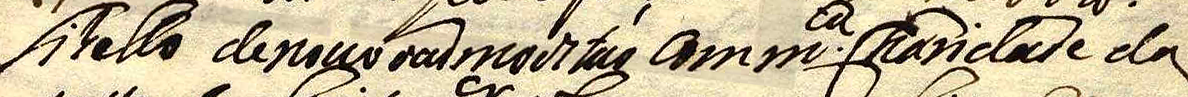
libello de nouo o adomoestaõ com mta. Charidade da
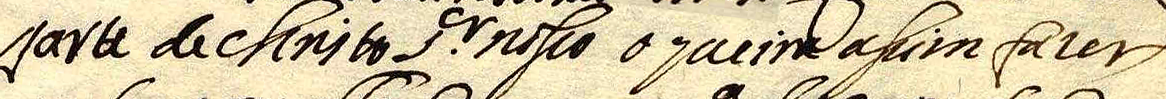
parte de christo s.or nosso o queira assim fazer
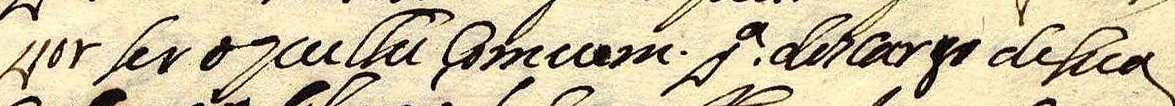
por ser o que lhe Comuem. p.a descargo de sua
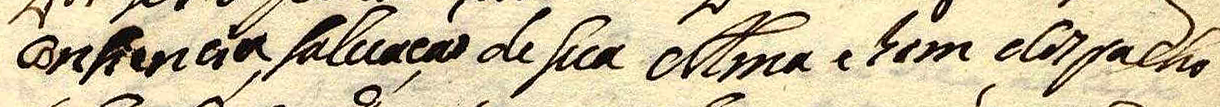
consiencia, saluaçaõ de sua Alma e bom despacho
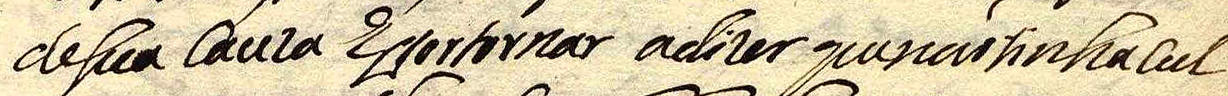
de sua cauza E por tornar a dizer que naõ tinha cul
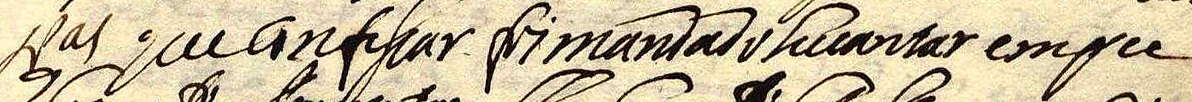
pas que confessar foi mandado leuantar em pee
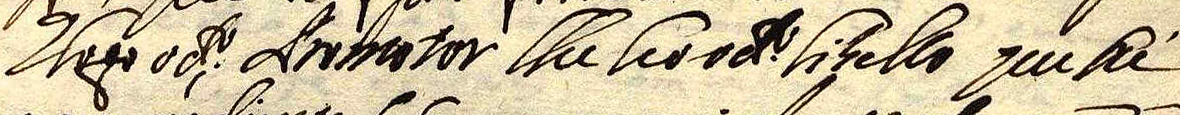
E logo o d.o Promotor lhe leo o do. libello que hé
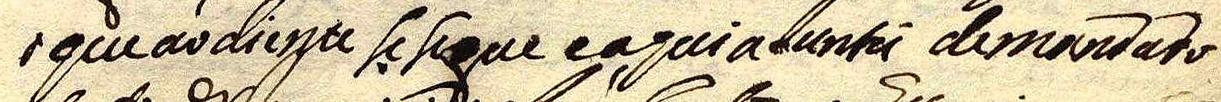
o que ao diente se segue e aqui aIuntei de mandado
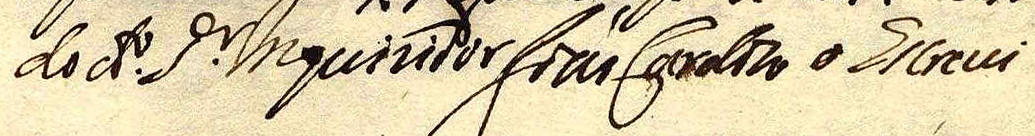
do d̄.o sor. Inquizidor Joaõ Cardozo o Escreui
